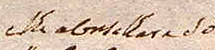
e lhe aconselhara so
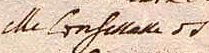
elle confessasse os
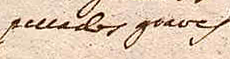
peccados graues
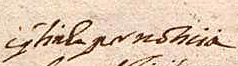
e q̄ tinha por noticia
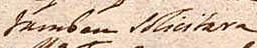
tambem solicitara
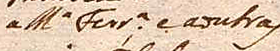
a Ma Ferr.a e a outras
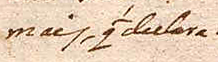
mais, q̄ declara.
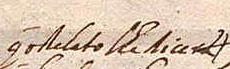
q̄ o Relato lhe dicera 4
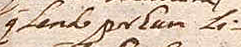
q̄ lendo por hum Li
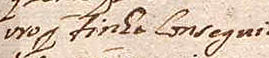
vro, q̄ tinha Conseguia
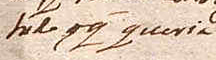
tudo o q̄ queria.
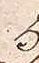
5
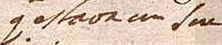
q̄ estava em seu
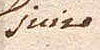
juizo.
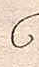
6
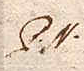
P.N.
